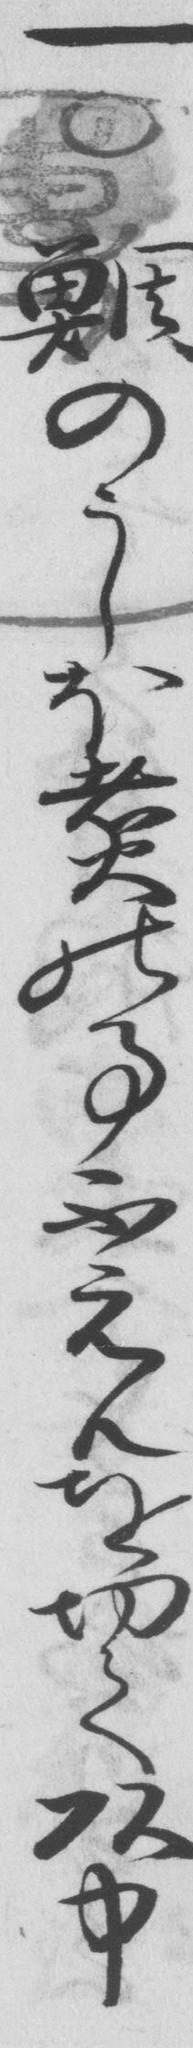一○鯛のうしほ煮の事ふえんを切て頭中
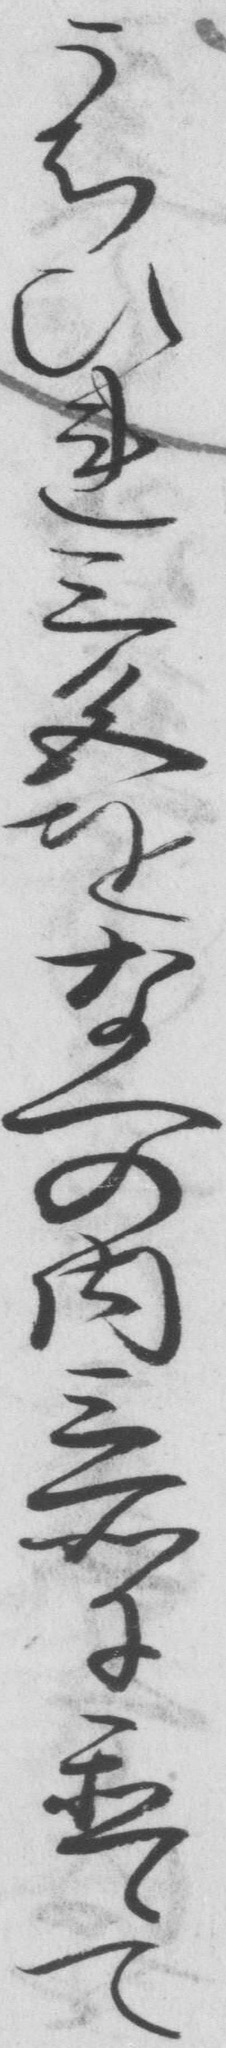うちひれ三色をなへの内三所に置候て
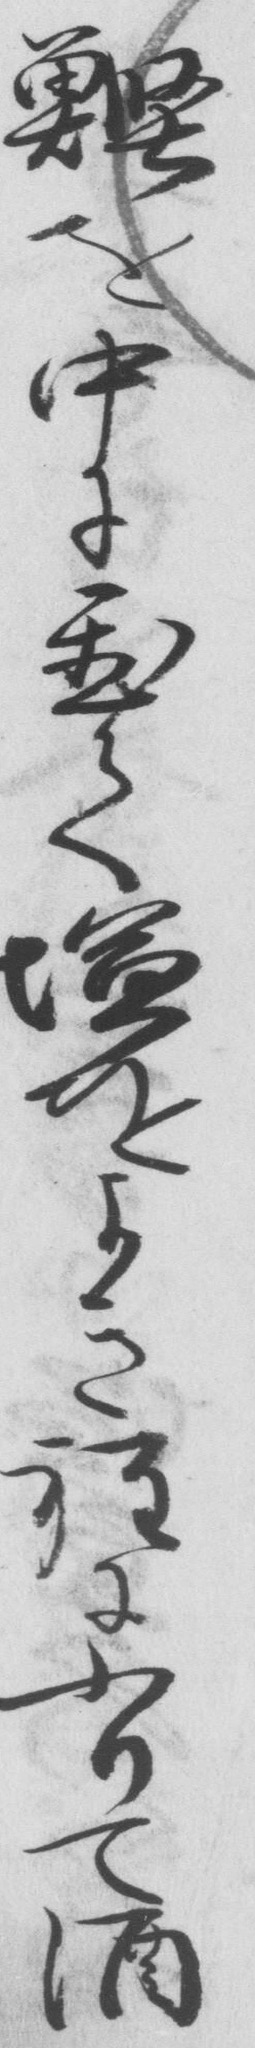鰹を中に置て塩をよき程にふりて酒
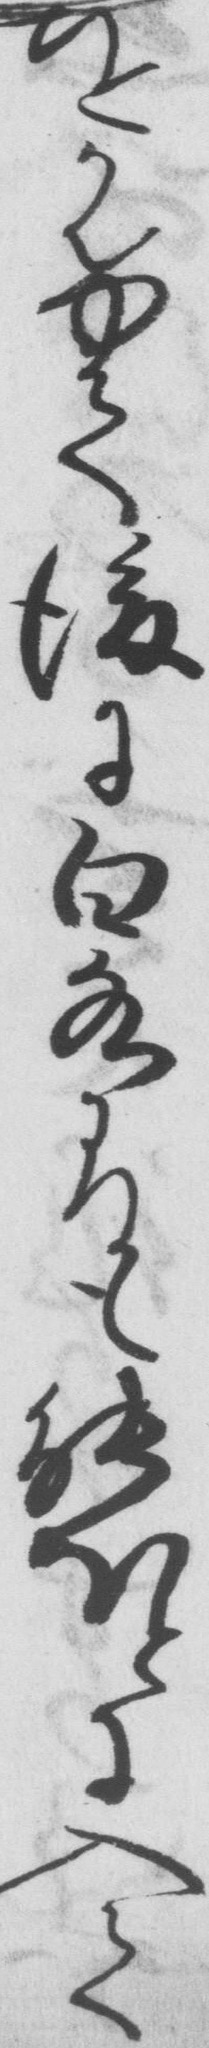をかけて後に白水にても能ほとに入て
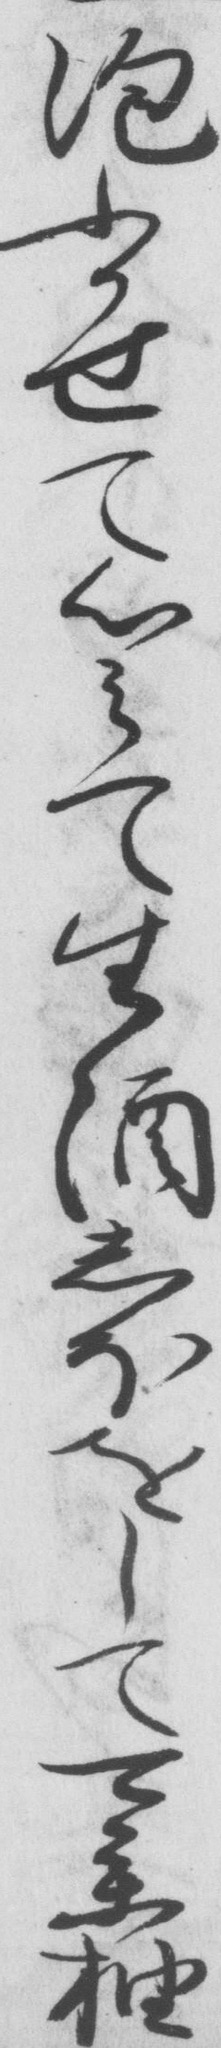一泡ふかせて心みて生酒しほをして可参柚
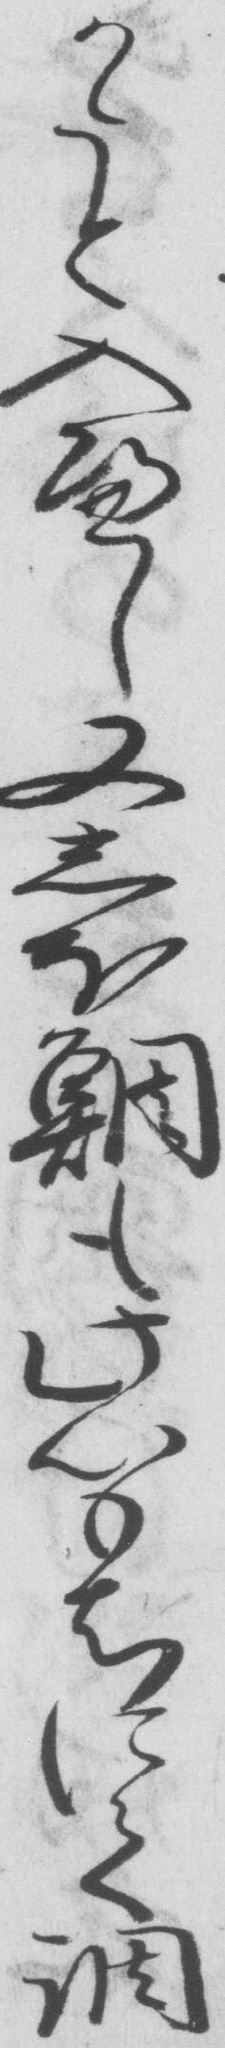かたく入へし又しほ鯛も此心もちにて調
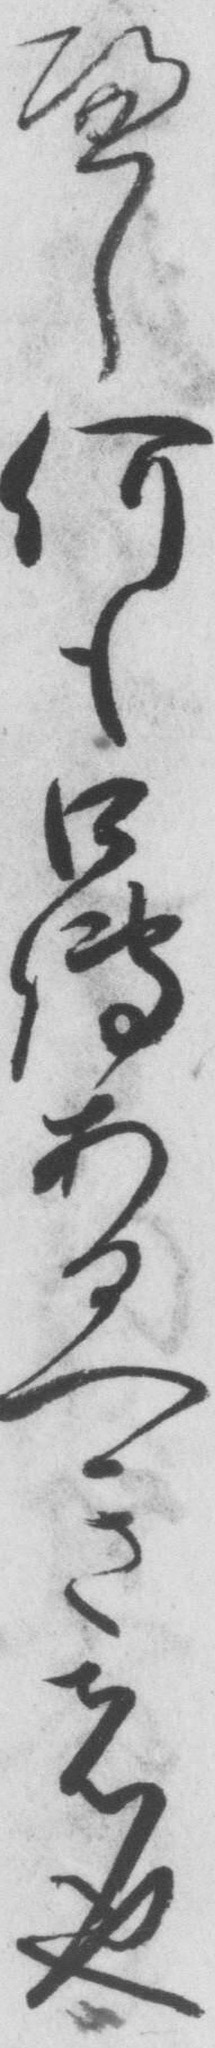へし何も口伝あるへき者也
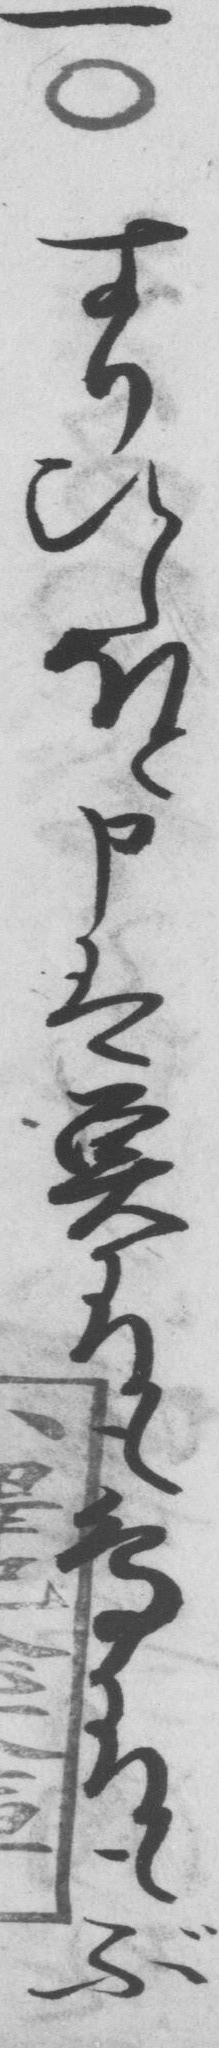一○すりひしほと申魚にても鳥にてもぶ

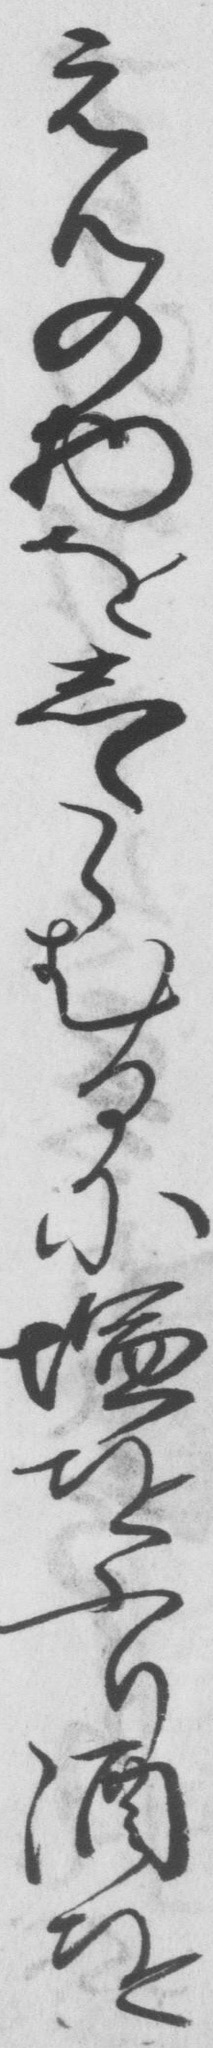えんの物をしたゝむるに塩をふり酒を
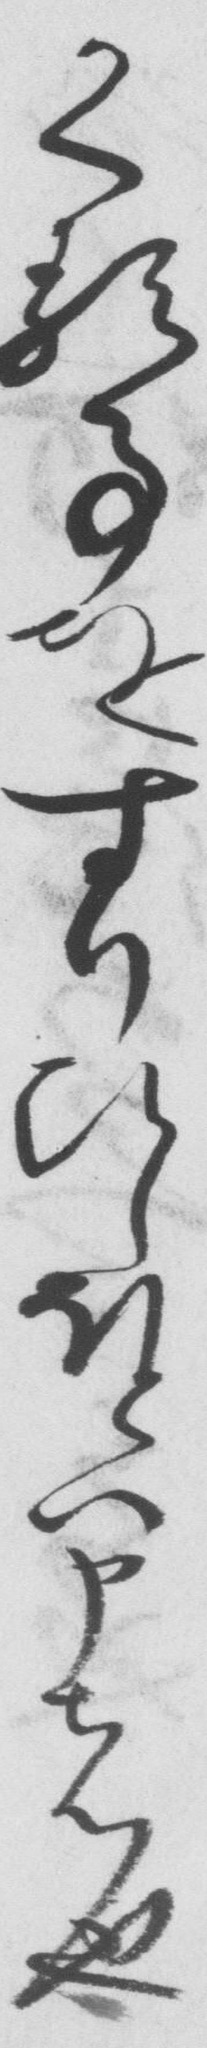かくる事をすりひしほとは申者也
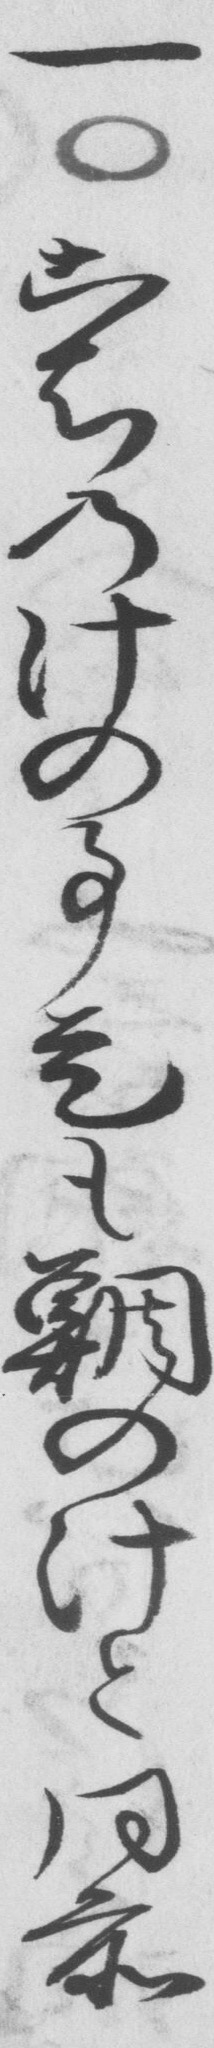一○こちの汁の事是も鯛の汁と同前
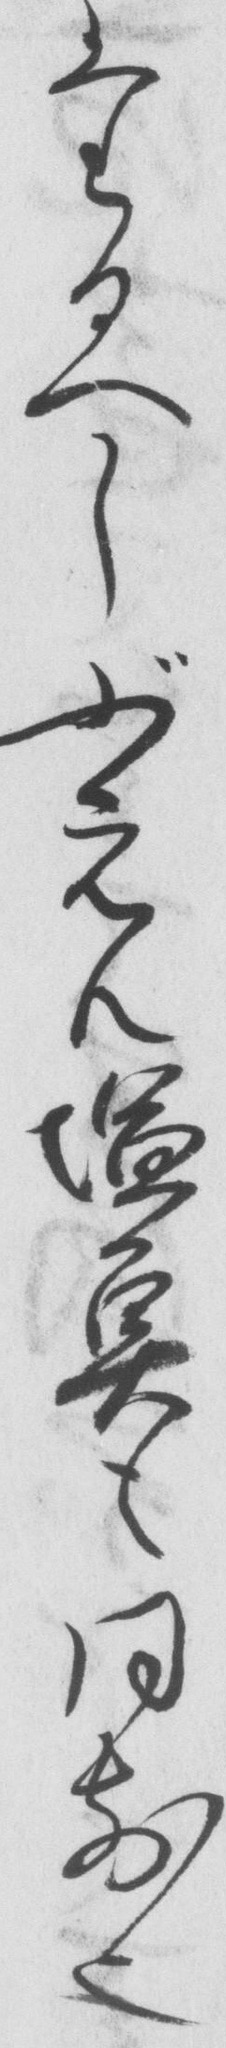たるへしぶえん塩魚も同前也
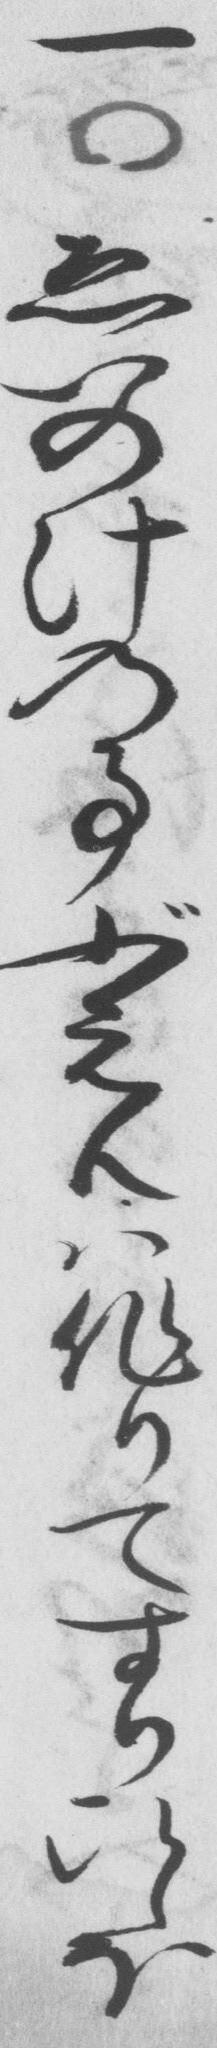一○ゑいの汁の事ぶえんは作りてすりひしほ
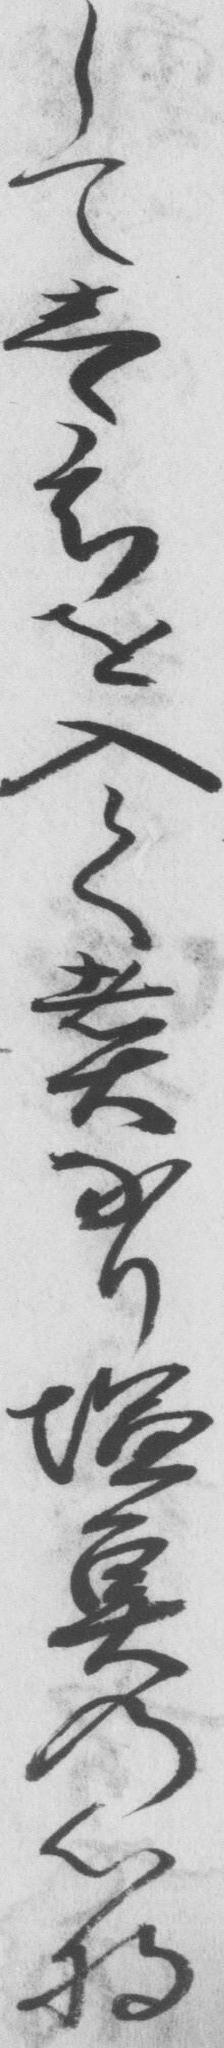してしたちを入て煮なり塩魚の心持
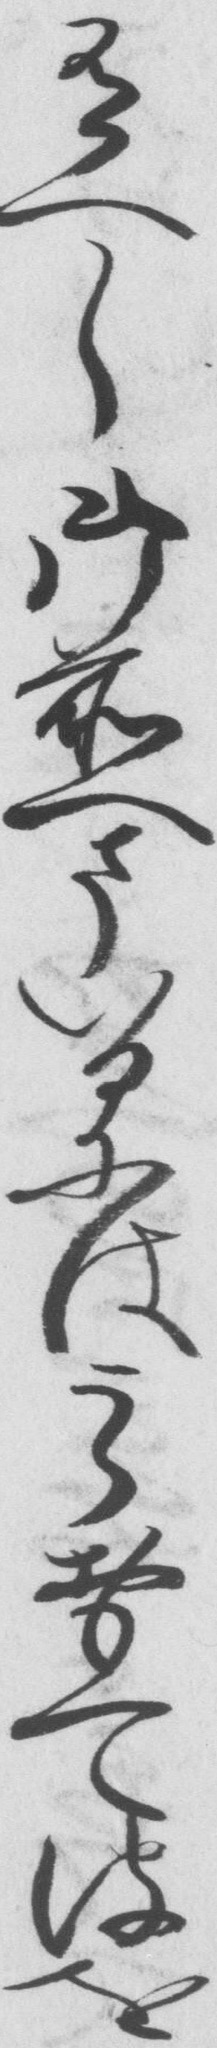有へし御前へまいるにはうらおもて皮を
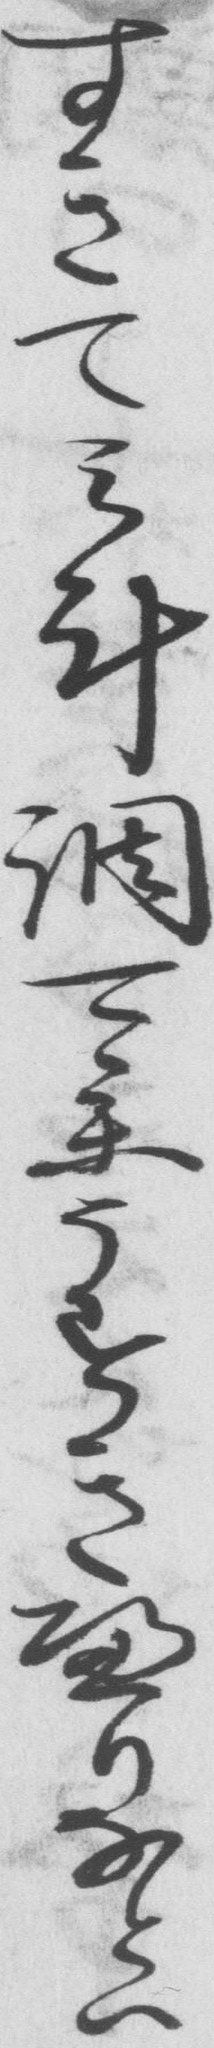すきてみ斗調可参うすきへりなとは
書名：料理次第
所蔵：大阪府立大学学術情報センター 国文学研究資料館
